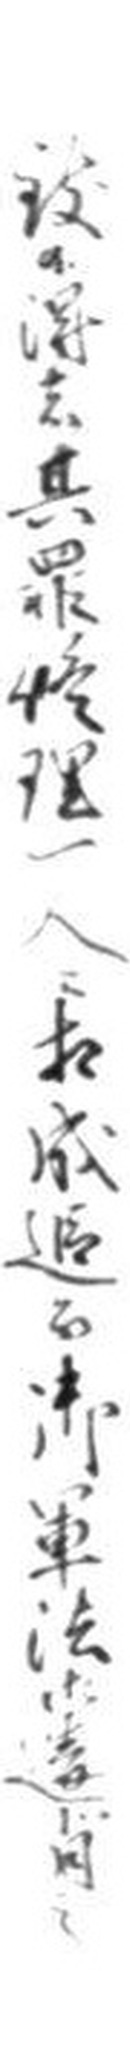致候得者其罪修理一人ニ相成追而御軍法御違背之
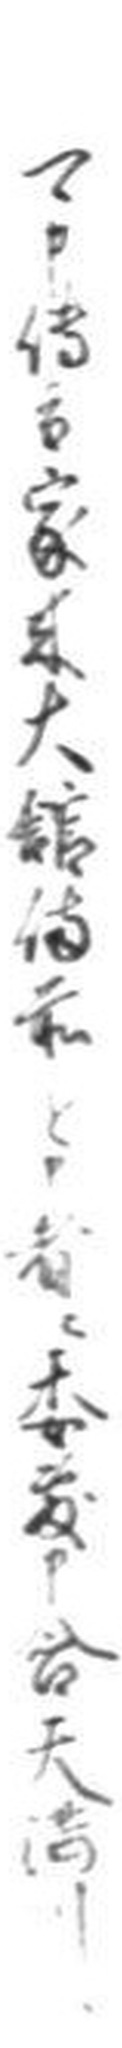可申伝旨家来大館備前と申者ニ委敷申含天満川
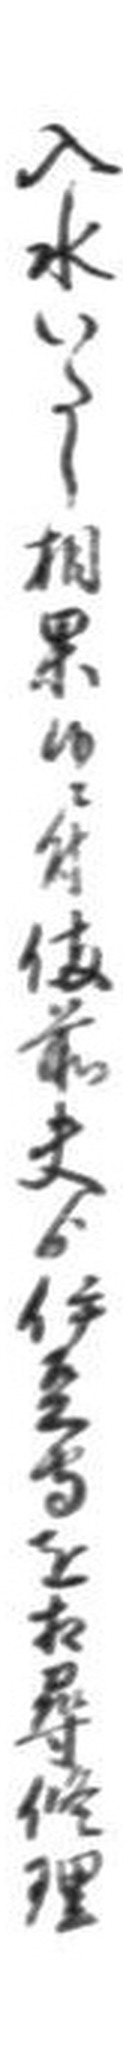入水いたし相果候ニ付備前夫ゟ伊豆守を相尋修理
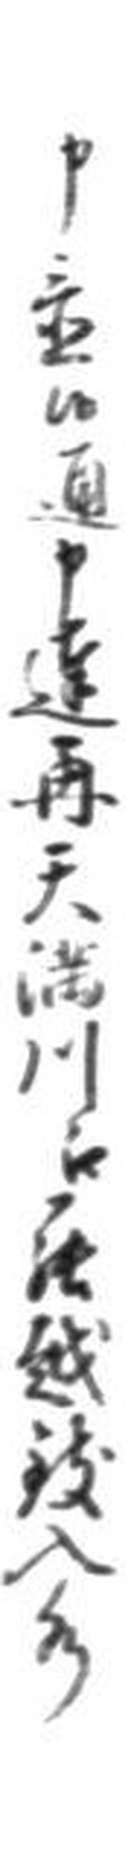申置候通申達再天満川江罷越致入水
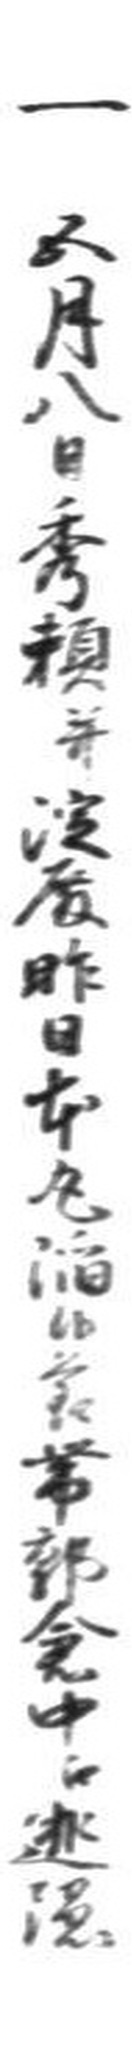一五月八日秀頼并淀殿昨日本丸候節帯郭倉中江逃隠
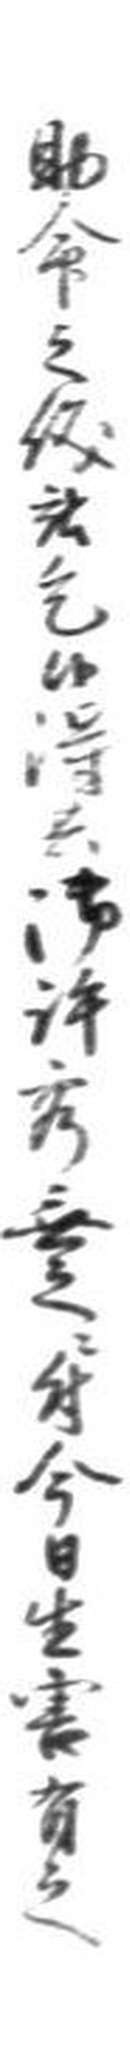助命之儀被乞候得共御許容無之ニ付今日生害有之
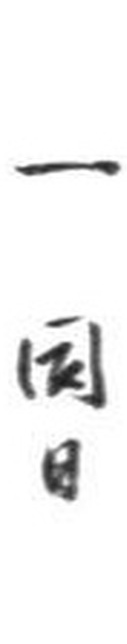一同日
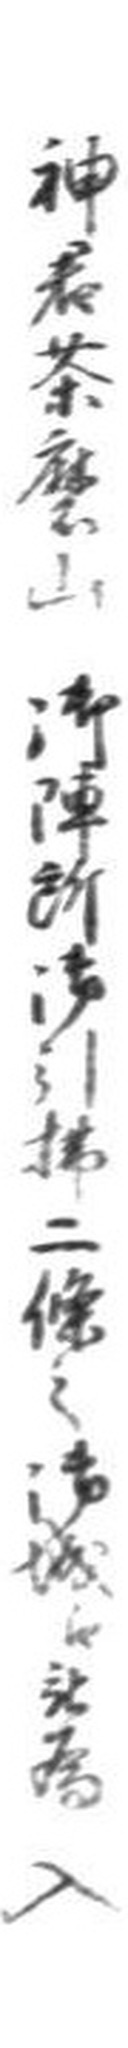神君茶磨山御陣所御引払二條之御城江被為入
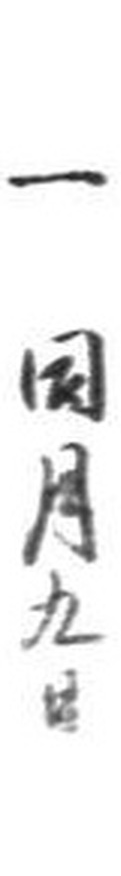一同月九日
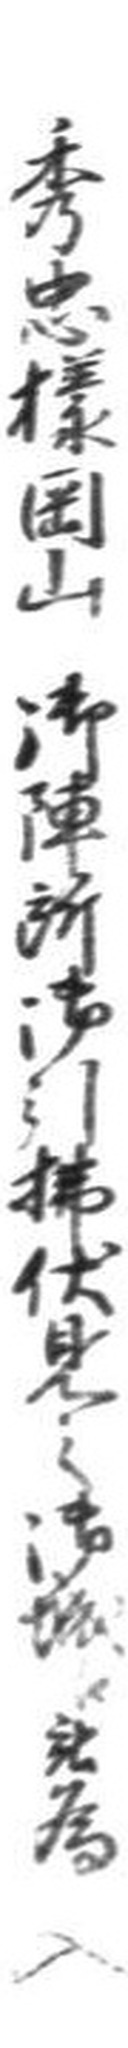秀忠様岡山御陣所御引払伏見之御城江被為入
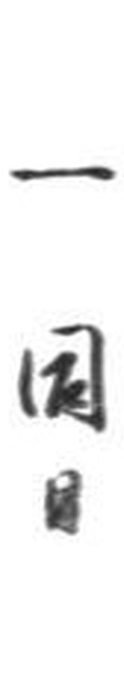一同日

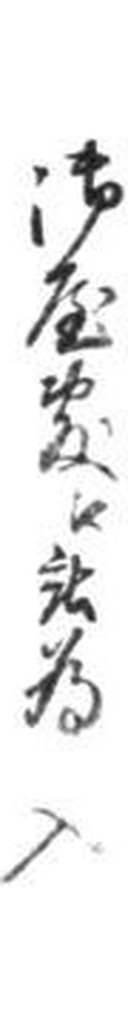御屋敷江被為入
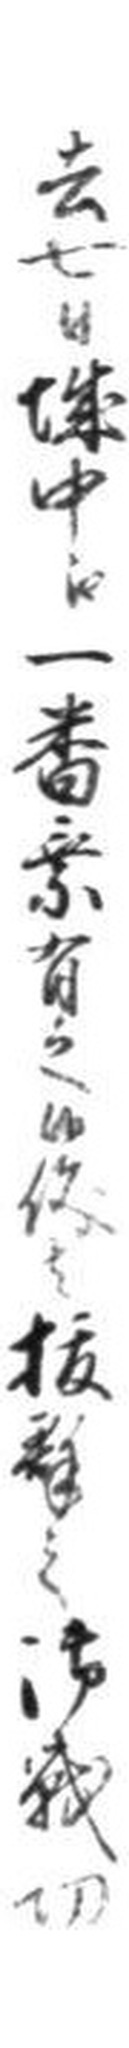去七日城中江一番乗有之候儀者抜群之御戦功
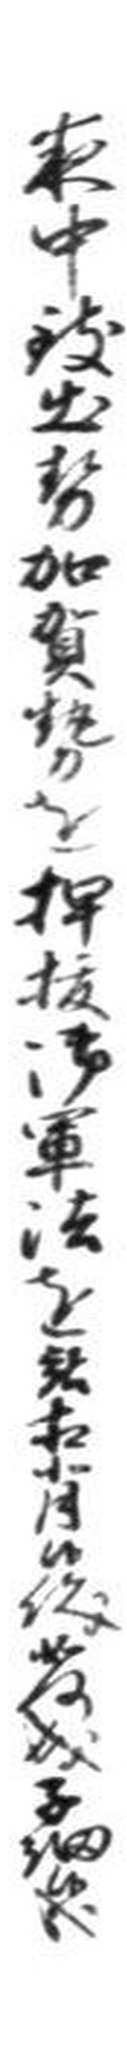夜中致出勢加賀勢を押抜御軍法を被相背候儀如何成子細候哉
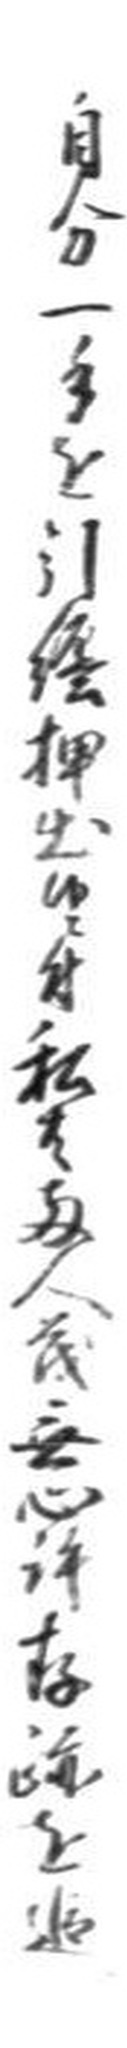自分一手を引纒押出候ニ付私共両人茂無心許存跡を追
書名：家譜 二 忠直公 従文禄四年到慶安四年
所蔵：福井県文書館 Fukui Prefectural Archives
